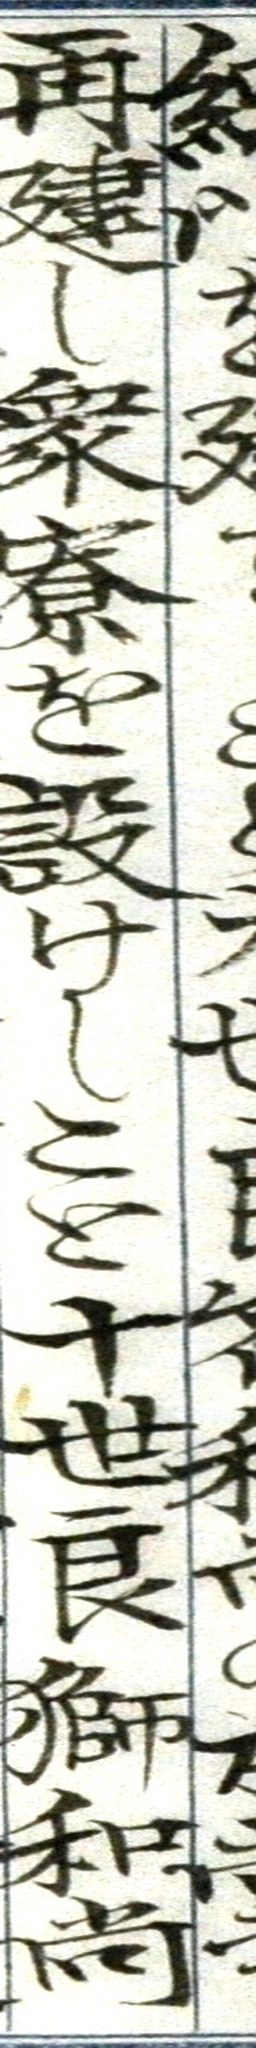再建し衆寮を設けしこと十世良獅和尚
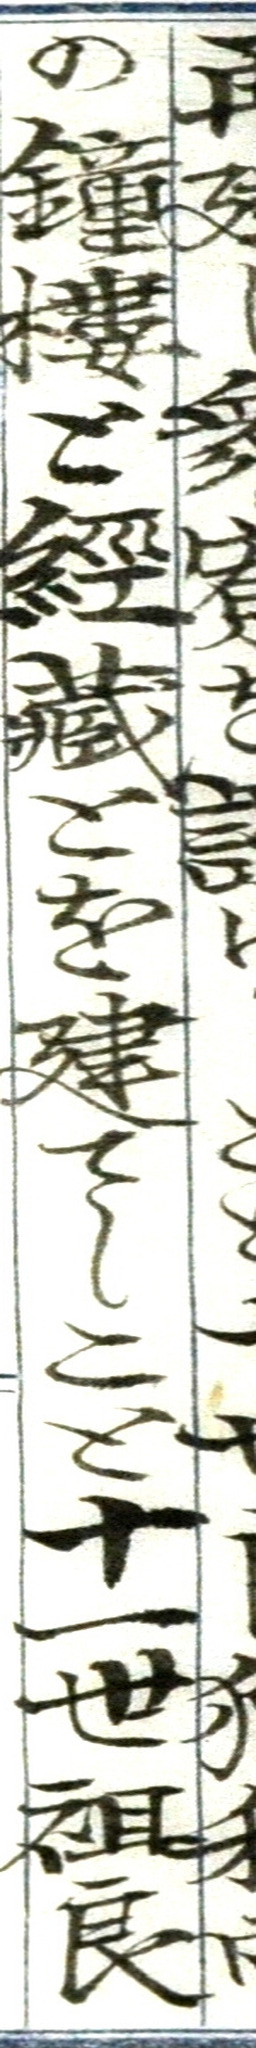の鐘楼と経蔵とを建てしこと十一世祖良

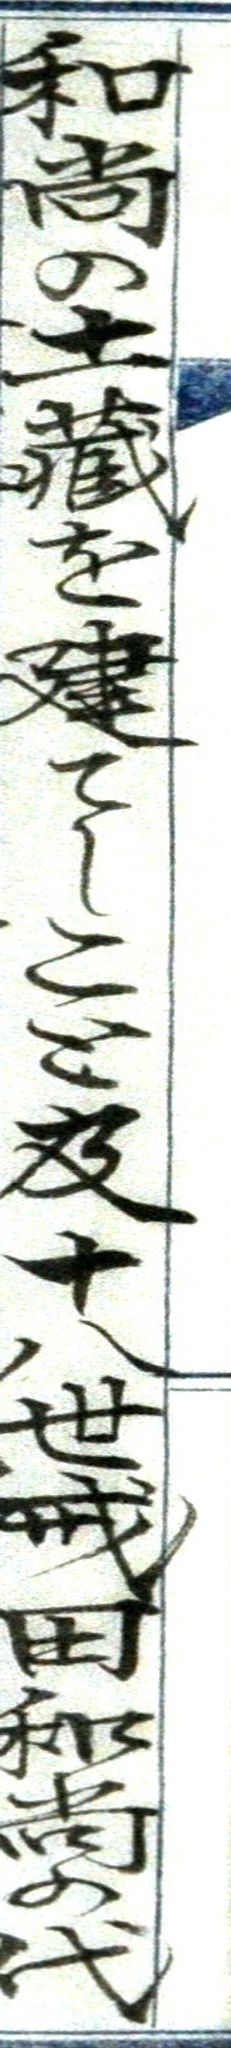和尚の土蔵を建てしこと及十八世戒田和尚の代
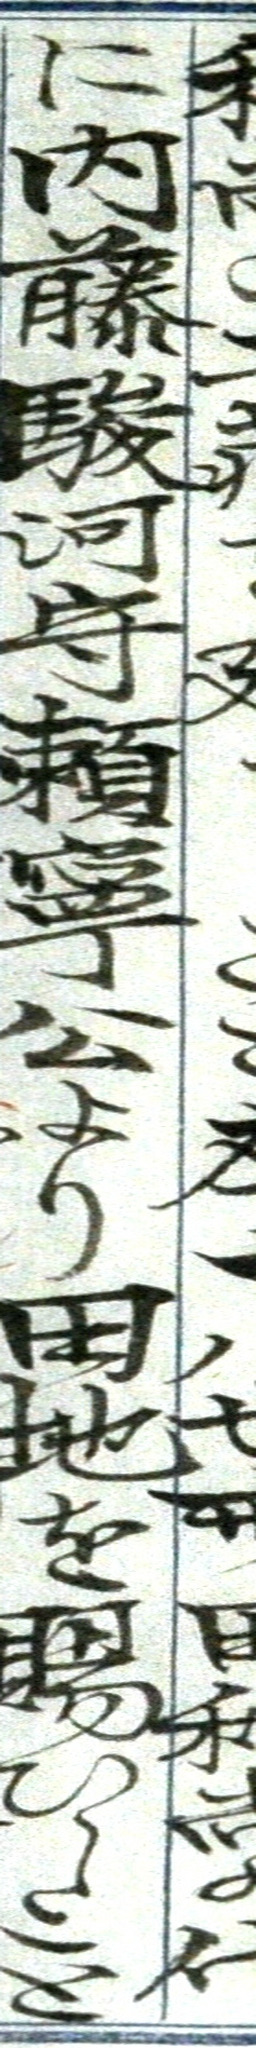に内藤駿河守頼寧公より田地を賜ひしこと
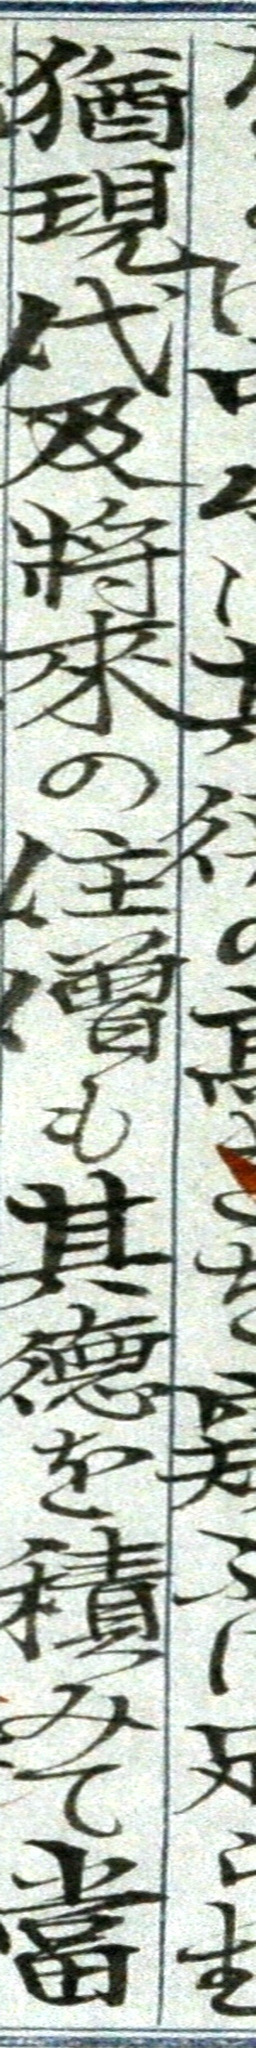猶現代及将来の住僧も其徳を積みて当
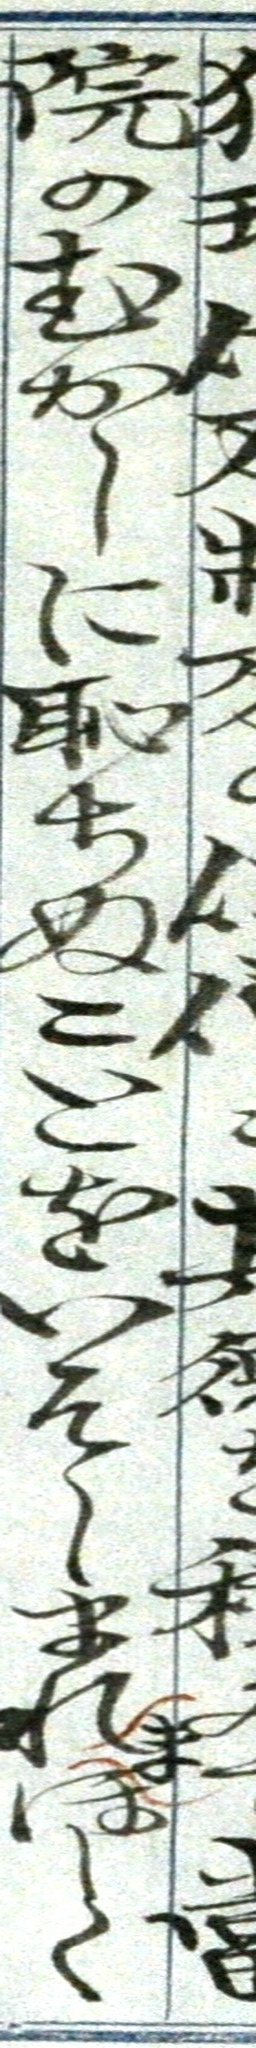院のむかしに恥ちぬことをいそしまれまほしく
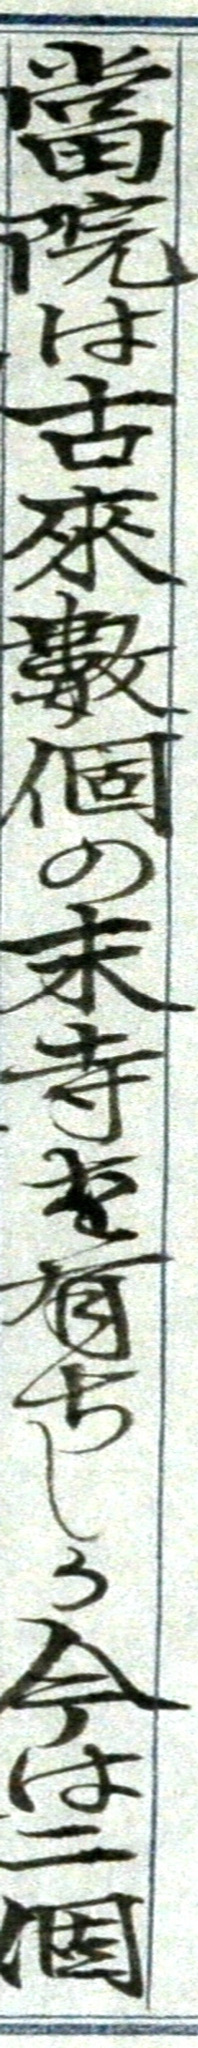当院は古来数個の末寺をを有ちしか今は二個
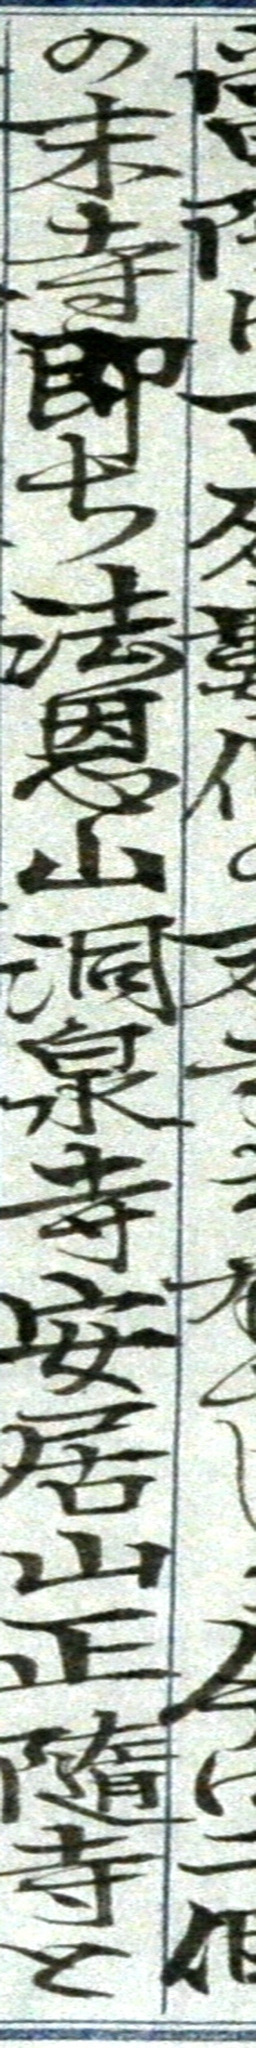の末寺即ち法恩山洞泉寺安居山正隨寺と
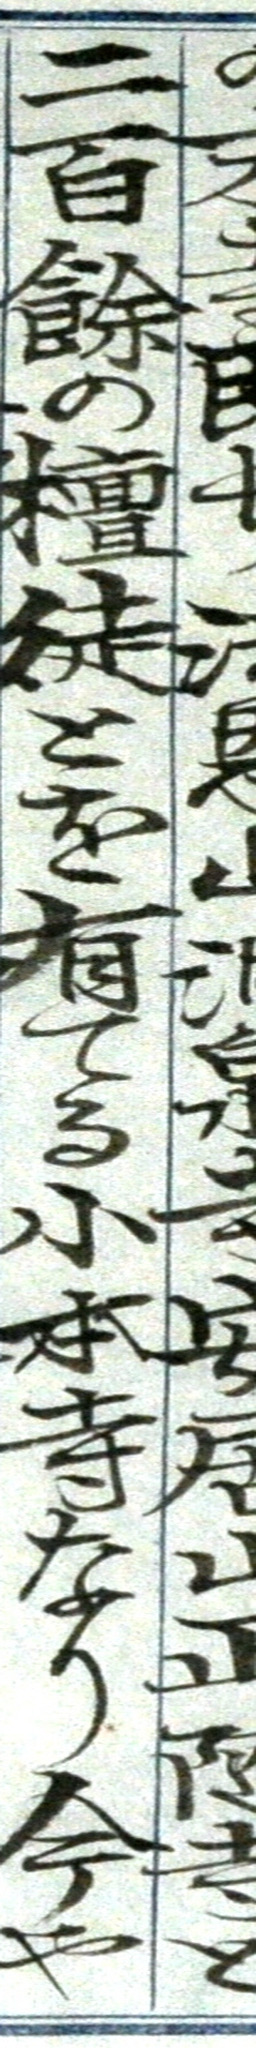二百余の檀徒とを有てる小本寺なり今や
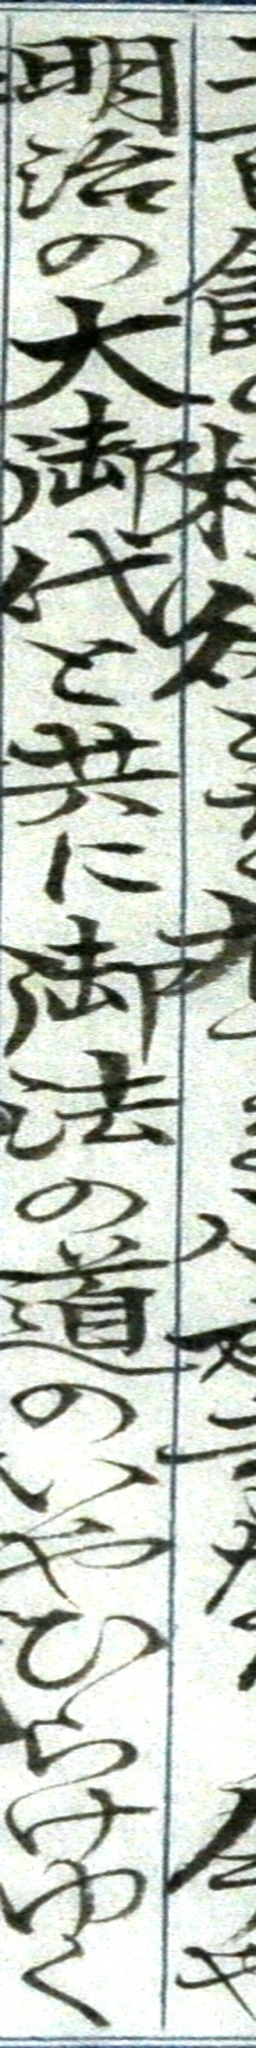明治の大御代と共に御法の道のいやひらけゆく
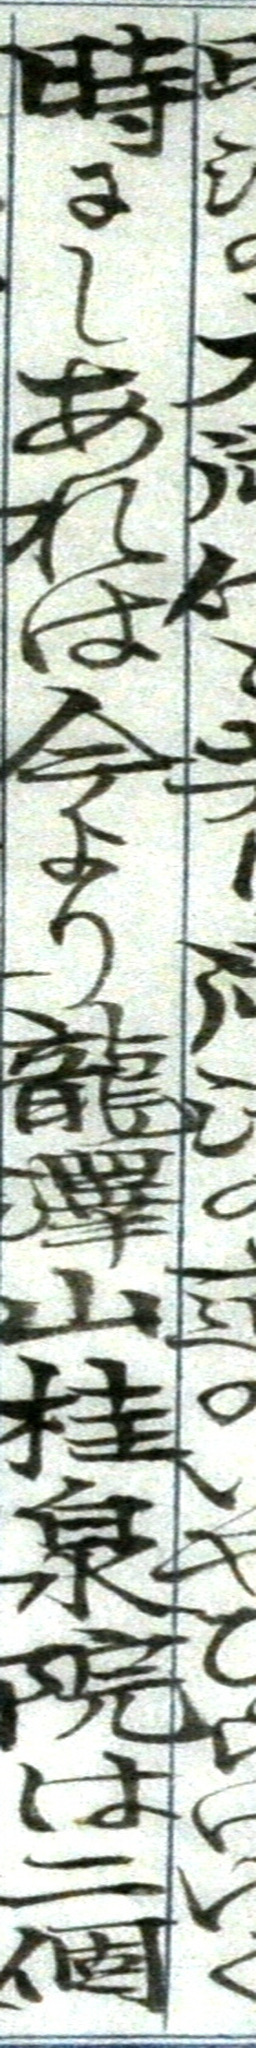時にしあれは今より龍澤山桂泉院は二個
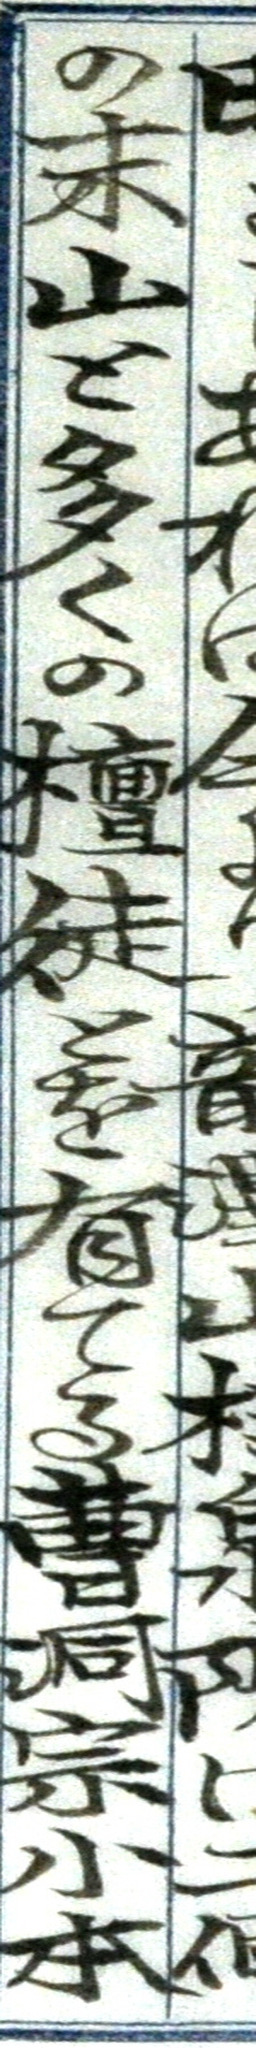の末山と多くの檀徒とを有てる曹洞宗小本
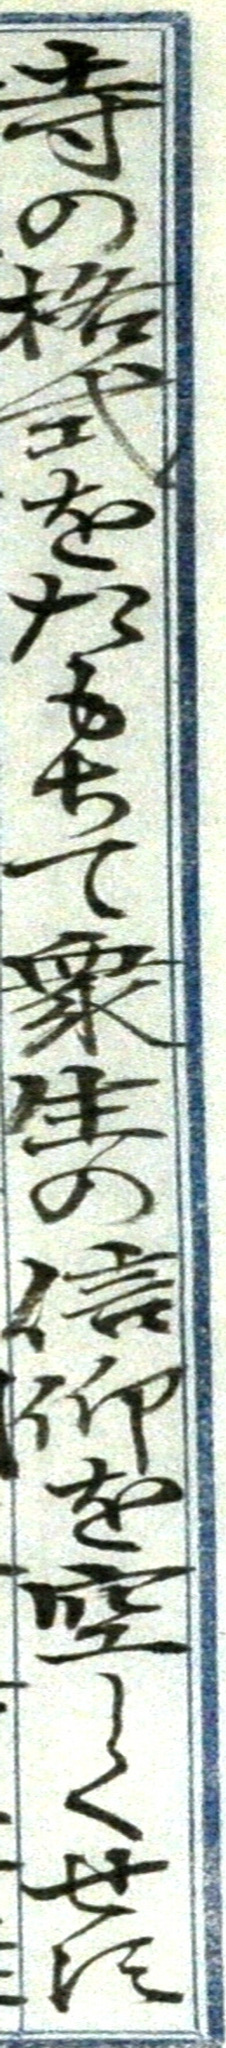寺の格式をたもちて衆生の信仰を空しくせす
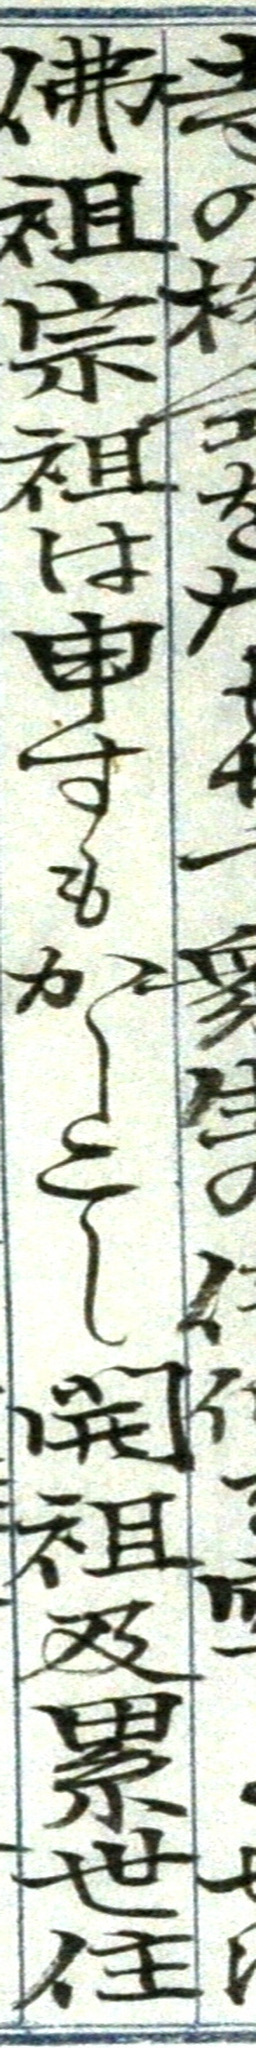仏祖宗祖は申すもかしこし開祖及累世住
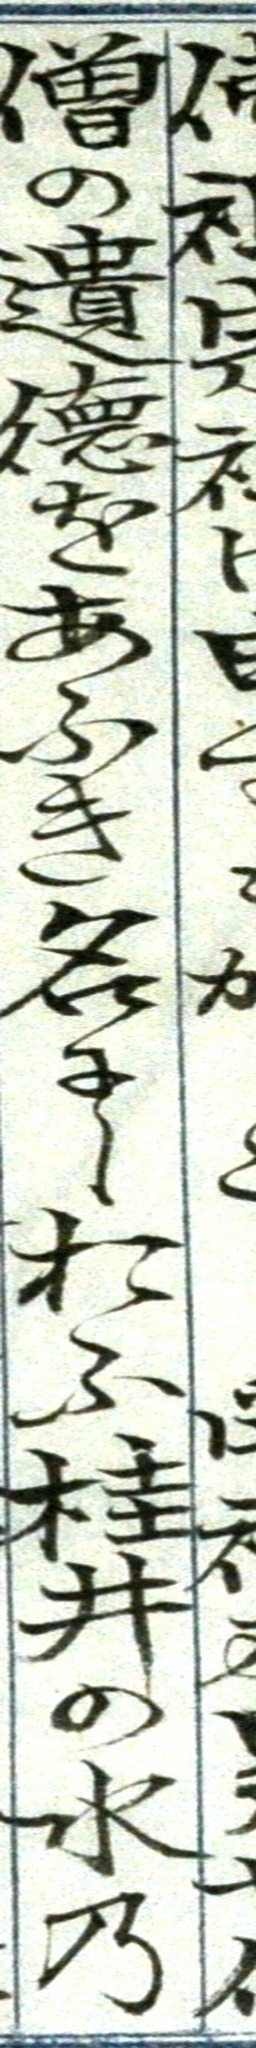僧の遺徳をあふき名にしおふ桂井の水乃
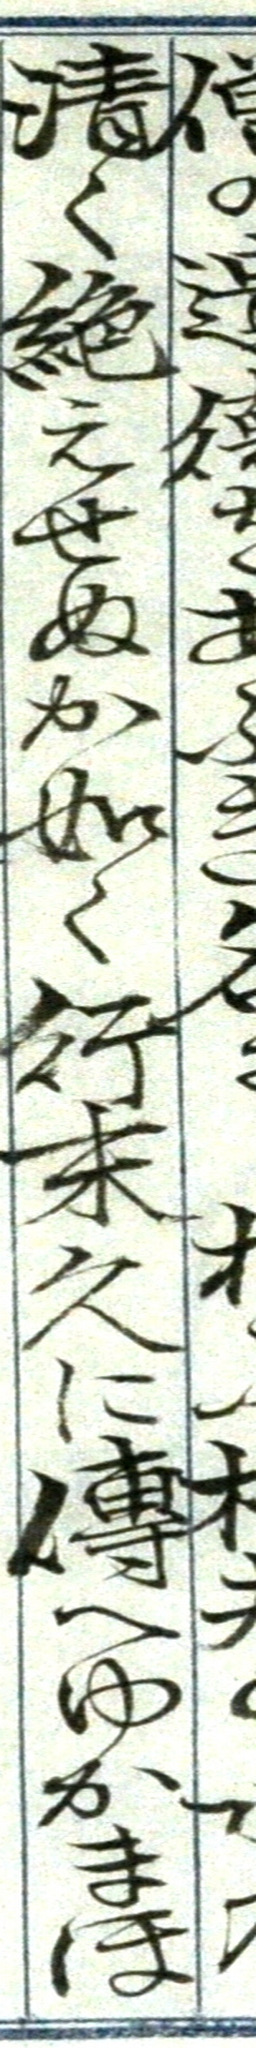清く絶えせぬか如く行末久に伝へゆかまほ
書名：桂泉院・樹林寺・東光寺縁起書、蓮華寺由来書、付夕顔観音記
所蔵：伊那市立高遠町図書館・合同会社AMANE
